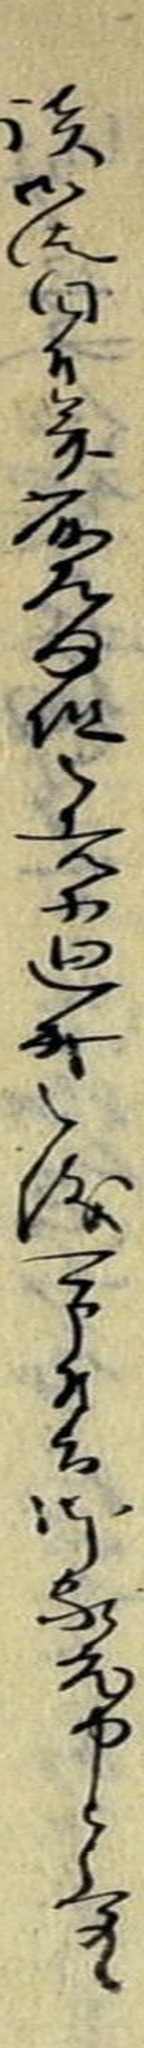談御徒目付并藤左衛門組之者相廻村之儀可申付旨御家老中被申聞候
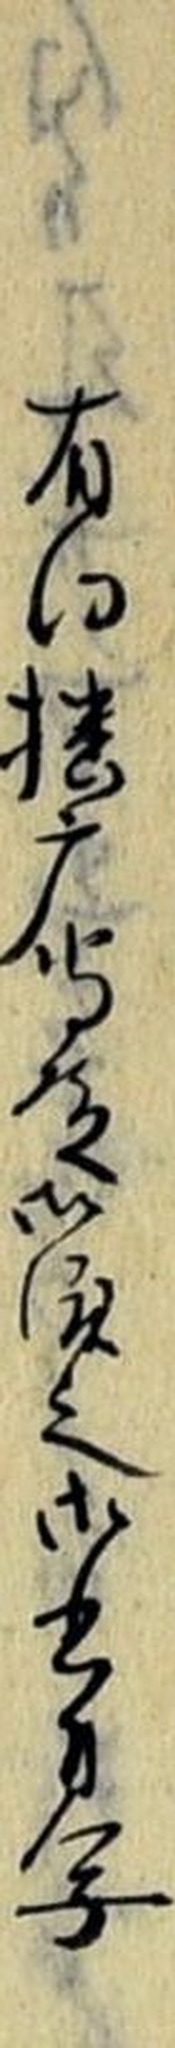有田播磨守殿御渡之御書付写
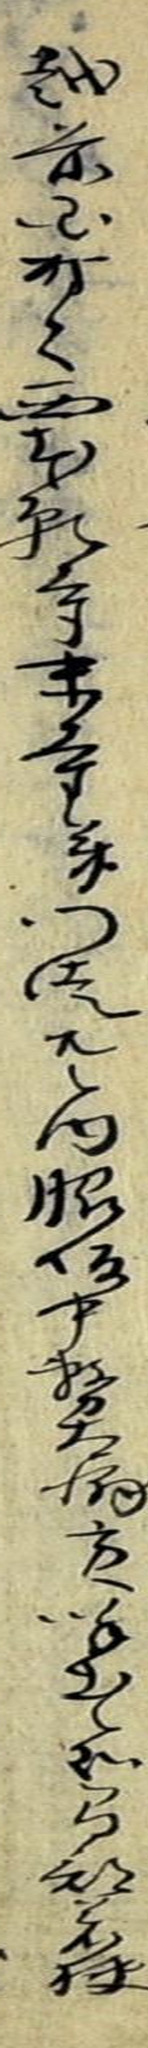越前国村々西本願寺末寺并門徒共之内脇坂中務太輔方へ呼出之処間部若狭
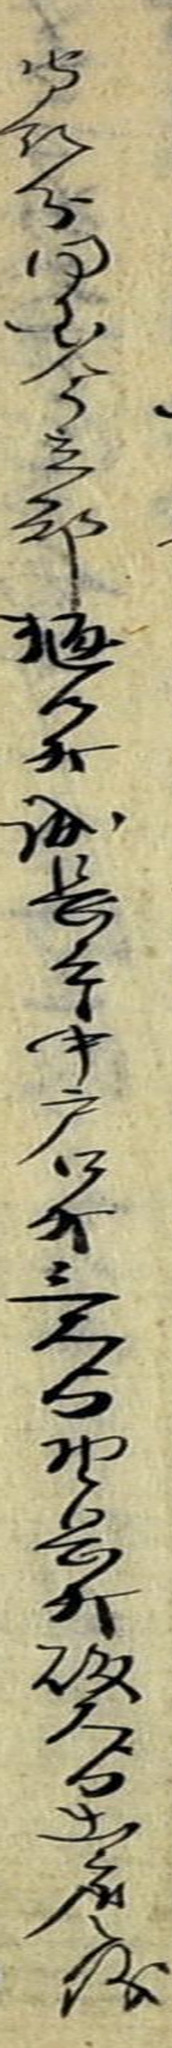守領分同国今立郡樋口村誠長寺中戸口村三左衛門野岡村磯右衛門出府之儀
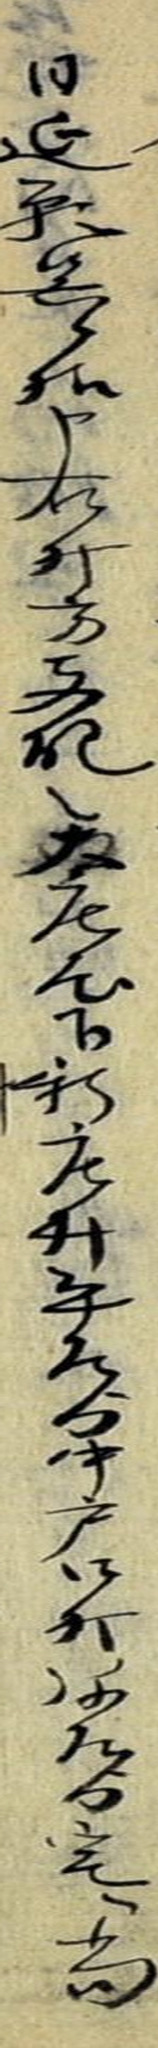日延願呉候様申右村方支配之大庄屋下新庄村平左衛門中戸口村弥左衛門宅へ当
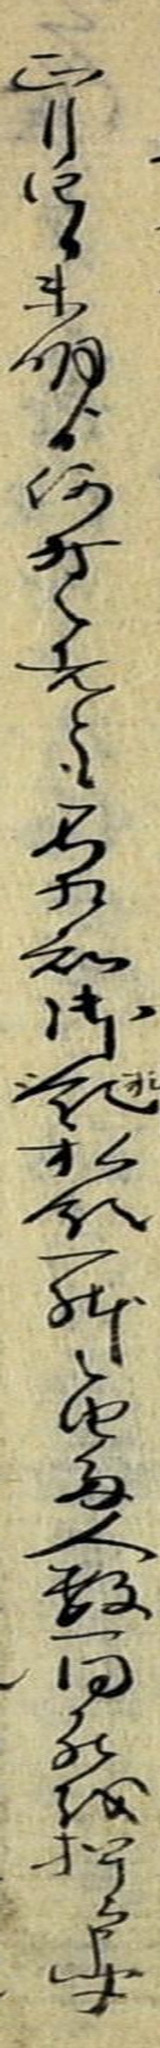正月四日未明ゟ何村之者とも不相知御領私領一体之由多人数一同罷越押而申聞
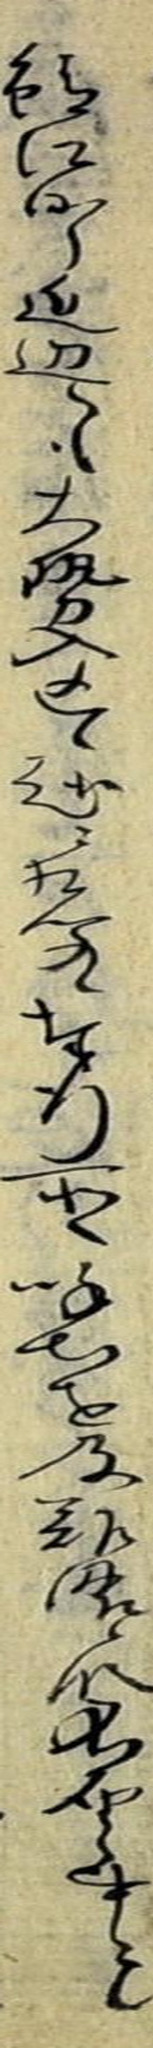鯖江町之近辺へも大勢入込候趣に相聞候奉行所へ呼出を及難渋候段不届之事に候
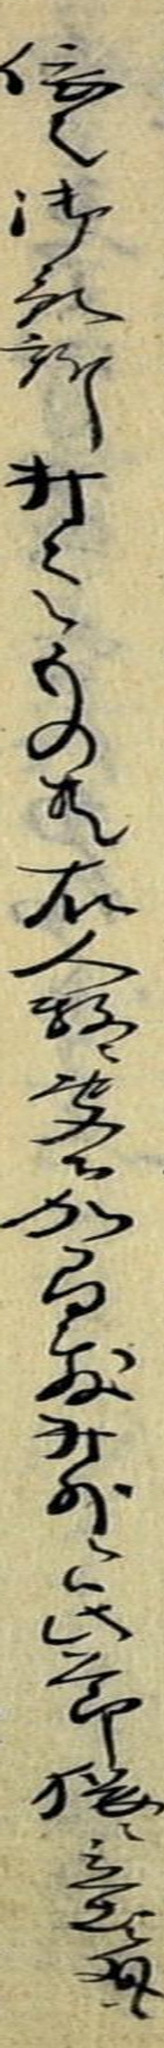依之御預所村々之もの共右人数に決而加間敷村外へは此節猥に立出候義も
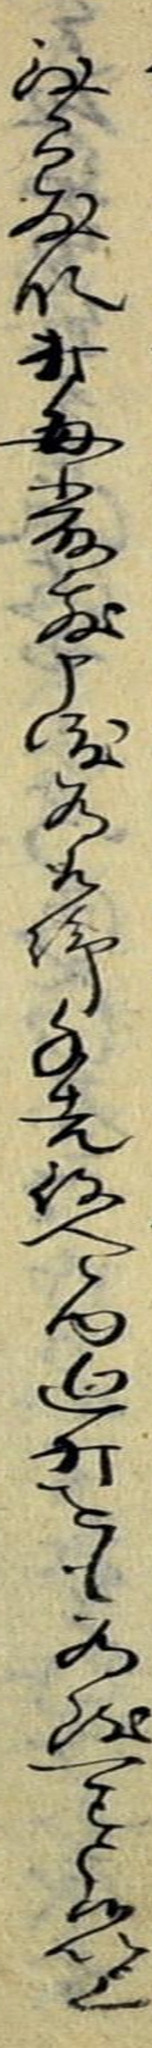致間敷段村毎厳敷申渡為取締手先役人之内廻村をも致可被申候以上
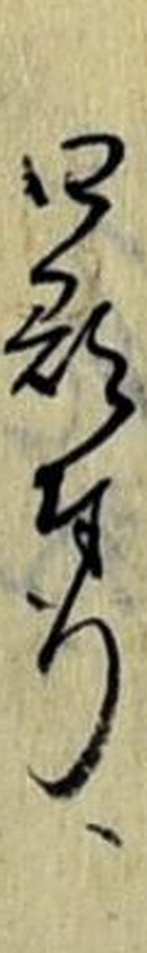四郡奉行へ
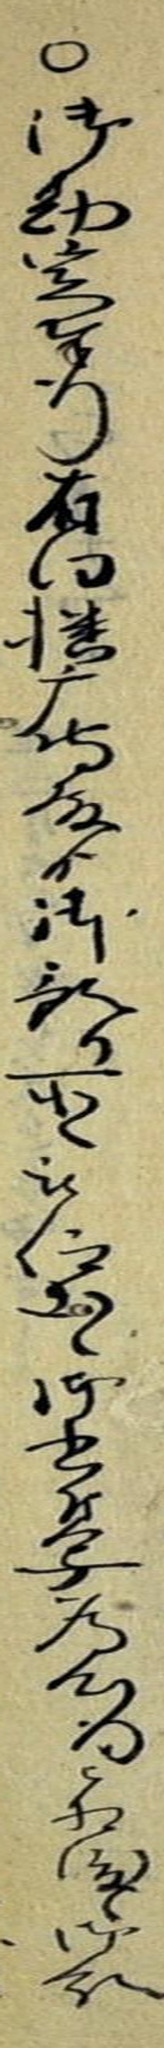○御勘定奉行有田播磨守殿ゟ御預り所へ被仰出候御書付写為心得被相渡候御領
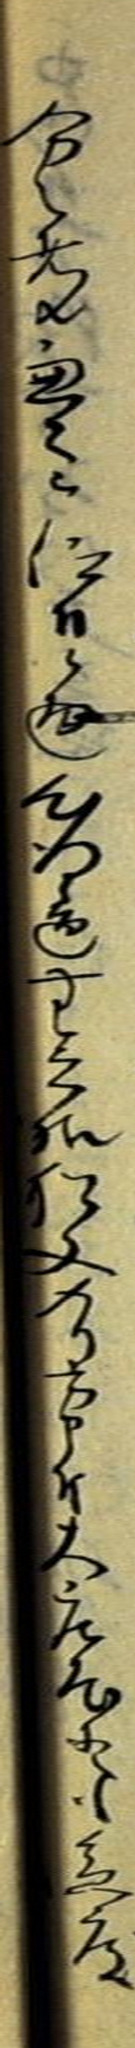分者共へ兼々被仰付候通心得違無之様猶又〆り方大庄屋共へも急度
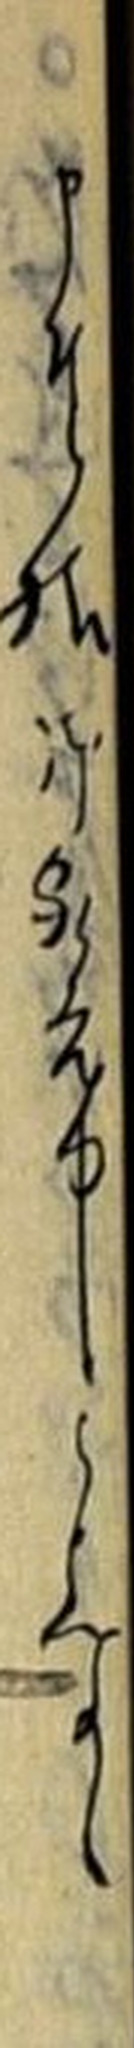申付候様御家老中被申聞候
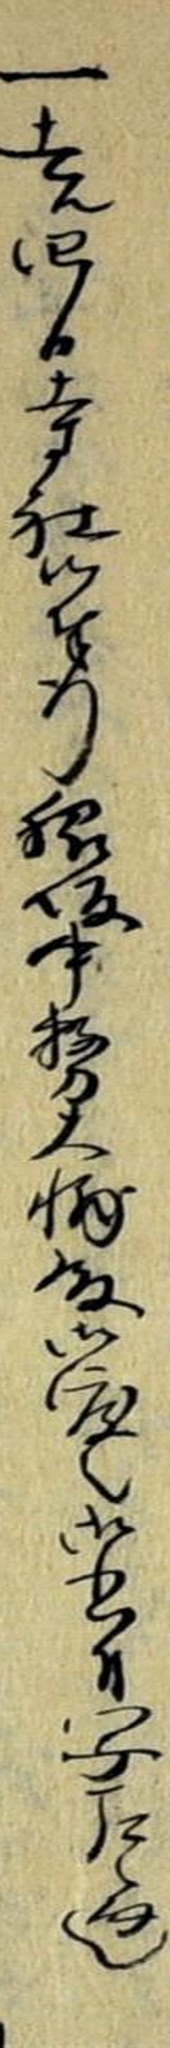一去ル四日寺社御奉行脇坂中務太輔殿御渡之御書付写左之通
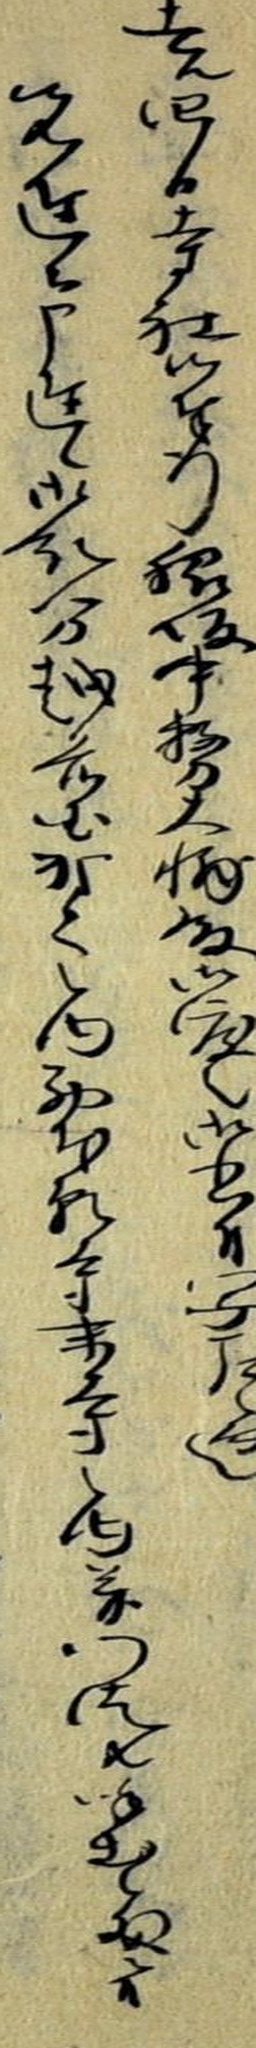先達而申達候御領分越前国村々之内西本願寺末寺之内并門徒共呼出之義に付
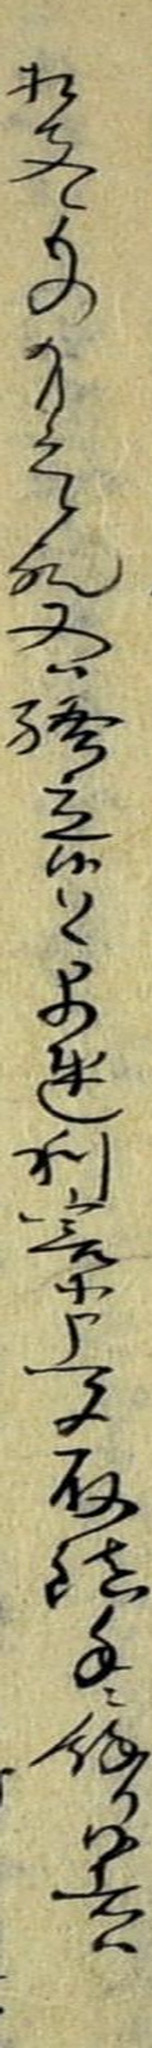指支候もの有之候歟又は騒立候はヽ早速利害等申聞取鎮手に餘り候者は
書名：命令之部 四
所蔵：福井県文書館 Fukui Prefectural Archives
